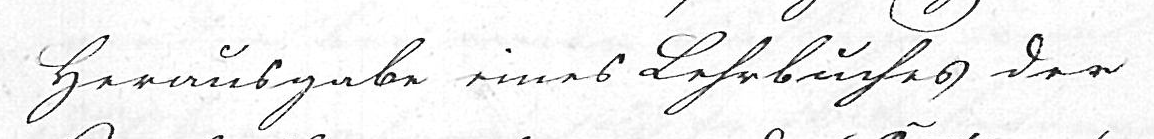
Herausgabe eines Lehrbuches der
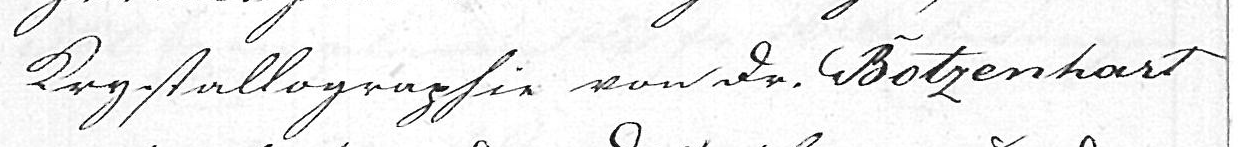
Krystallographie von Dr. Botzenhart
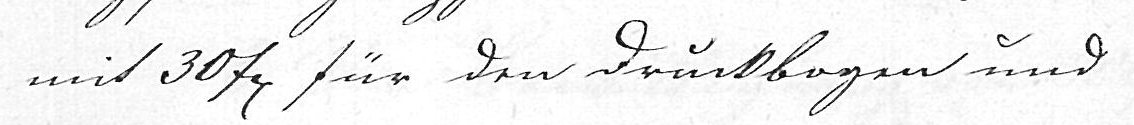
mit 30 fr für den Druckbogen und
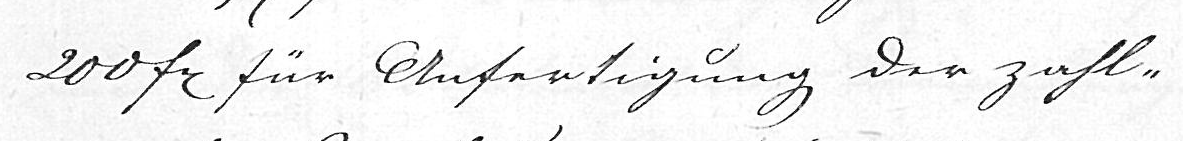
200 fr für Anfertigung der zahl-
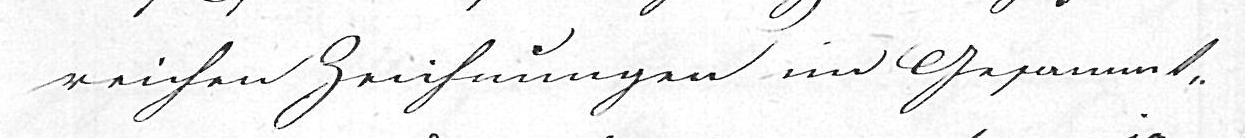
reichen Zeichungen in Gesammt-
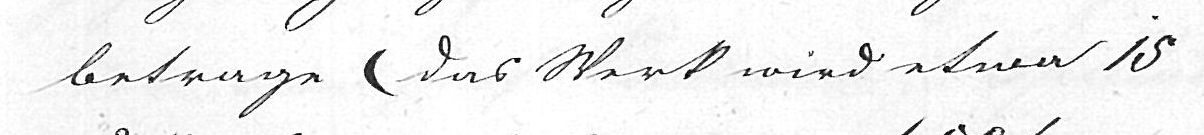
betrage (das Werk wird etwa 15
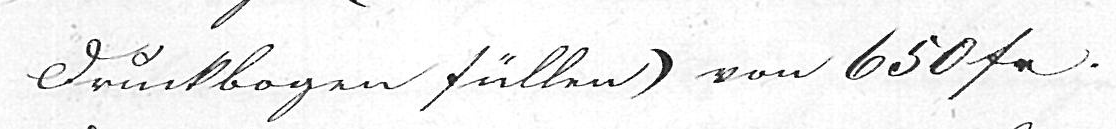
Druckbogen füllen) von 650 fr.
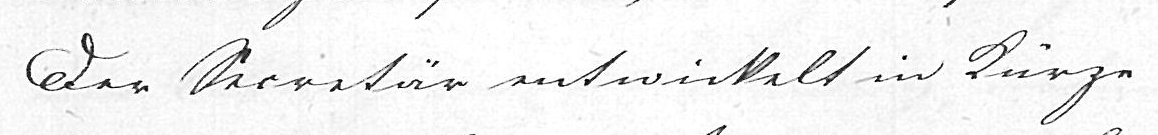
Der Secretär entwickelt in Kürze
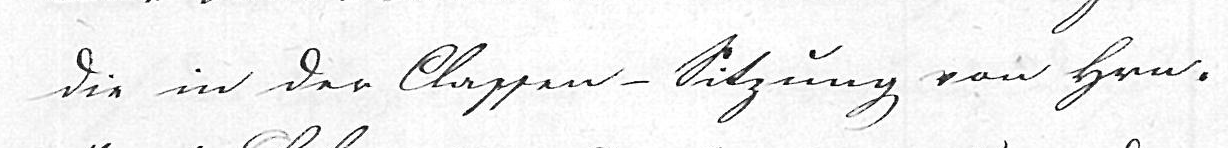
die in der Classen-Sitzung von Hrn.
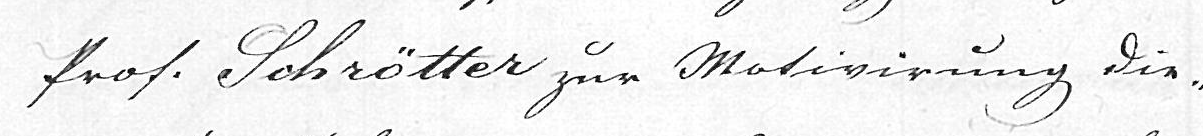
Prof. Schrötter zur Motivirung die-
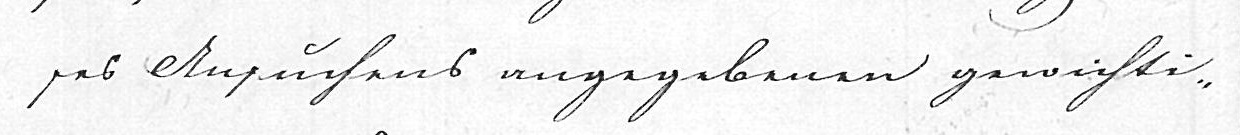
ses Ansuchen angegebenen gewichti-
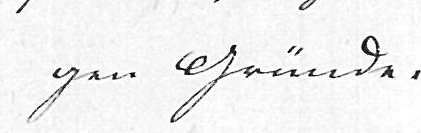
gen Gründe.
